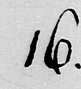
16.
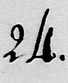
24.
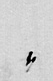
4.
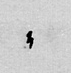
2.
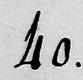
40.
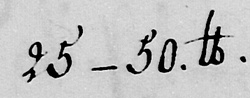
25–50. lb.
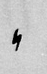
4.
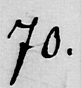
70.
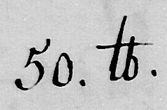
50. lb.
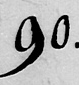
90.
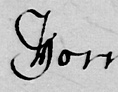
von
